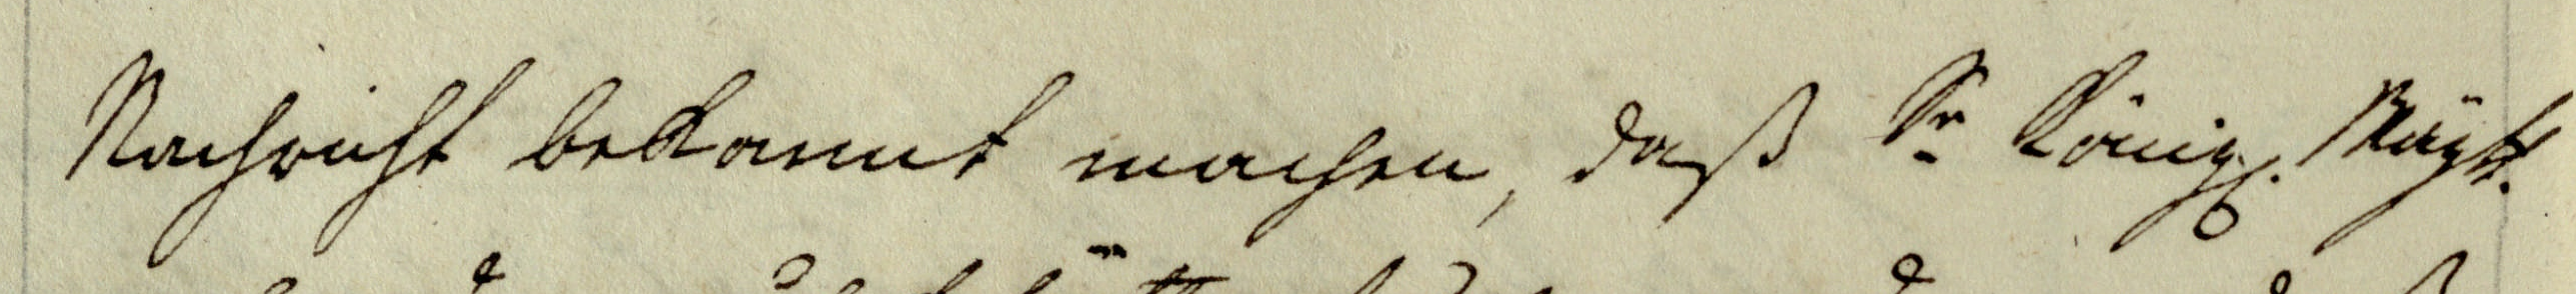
Nachricht bekannt machen, daß Sr Königl. Maÿtt.
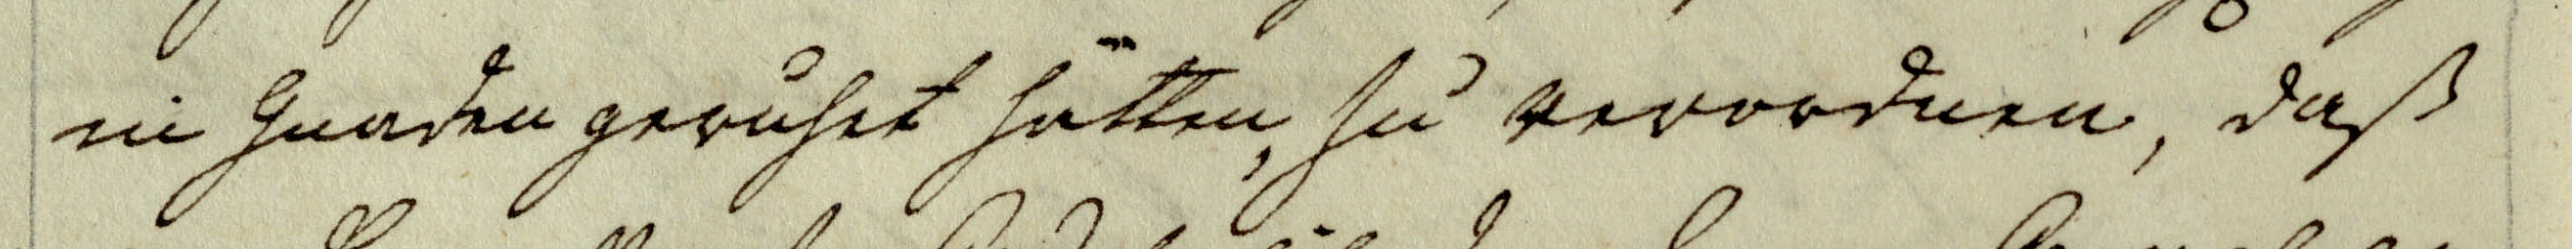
in Gnaden geruhet hätten, zu verordnen, daß
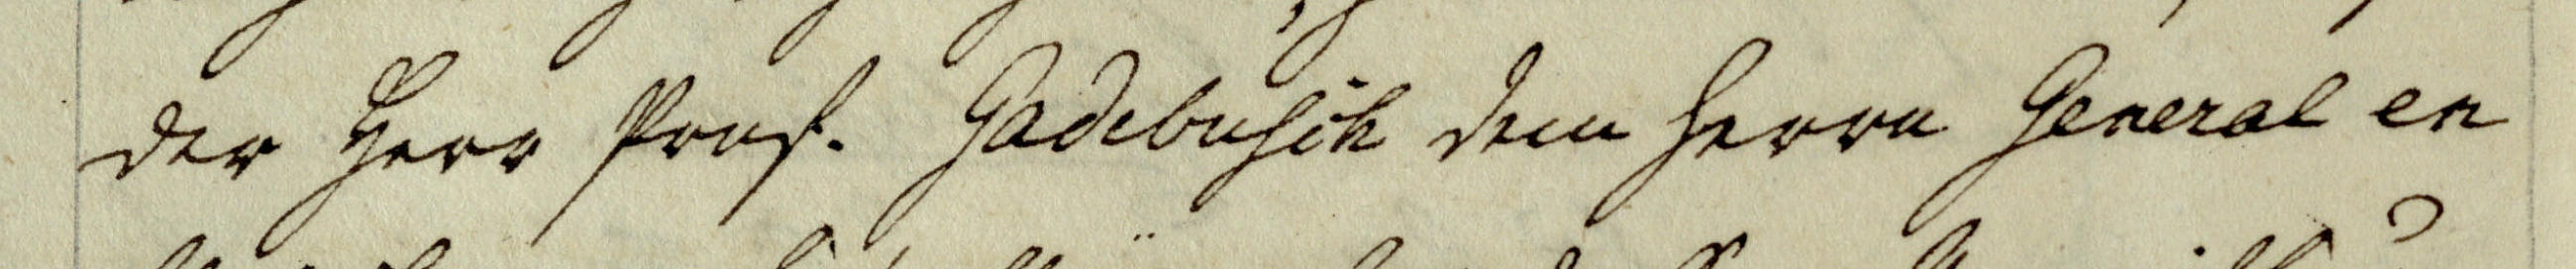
der Herr Prof. Gadebusch dem Herrn General en
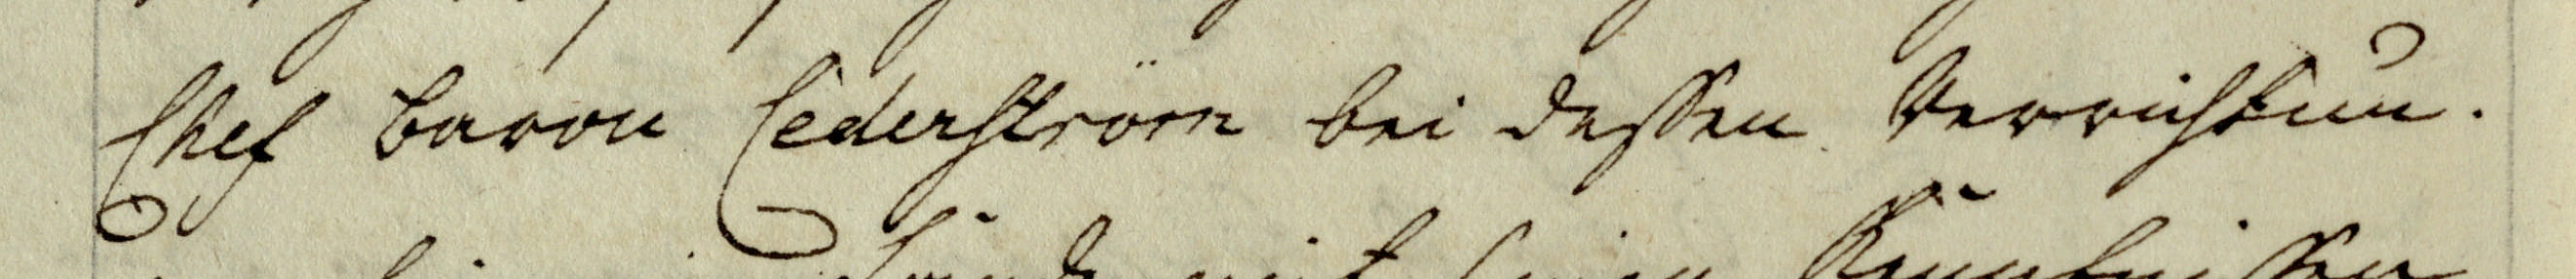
Chef Baron Cederström bei dessen Verrichtun¬
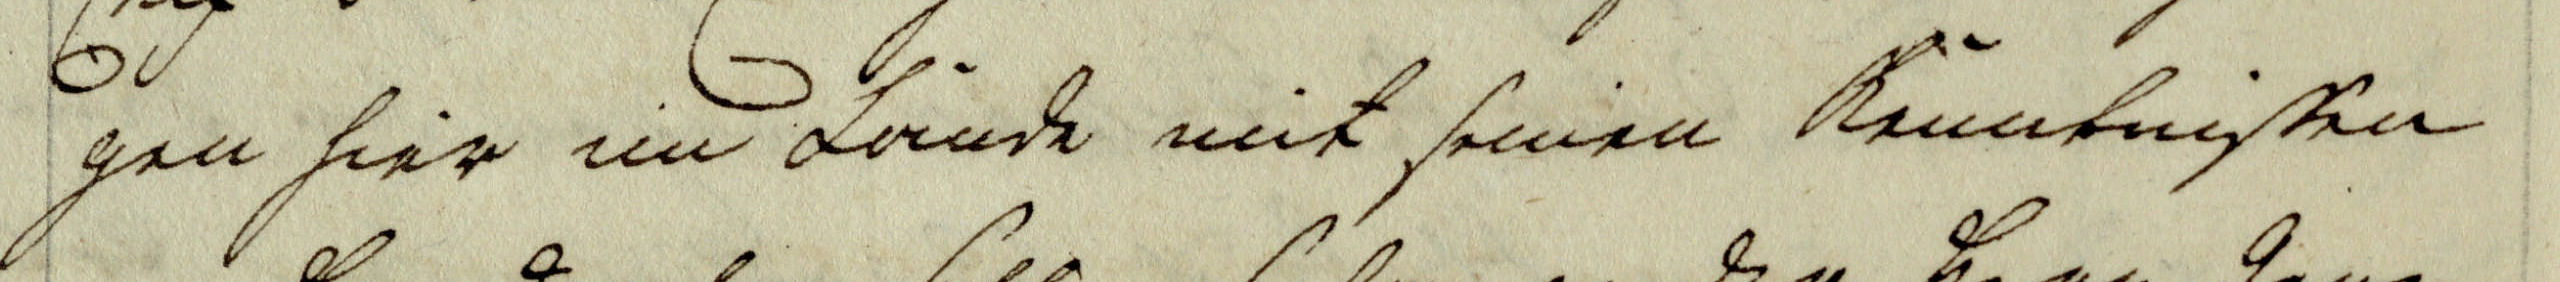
gen hier im Lande mit seinen Kenntnissen
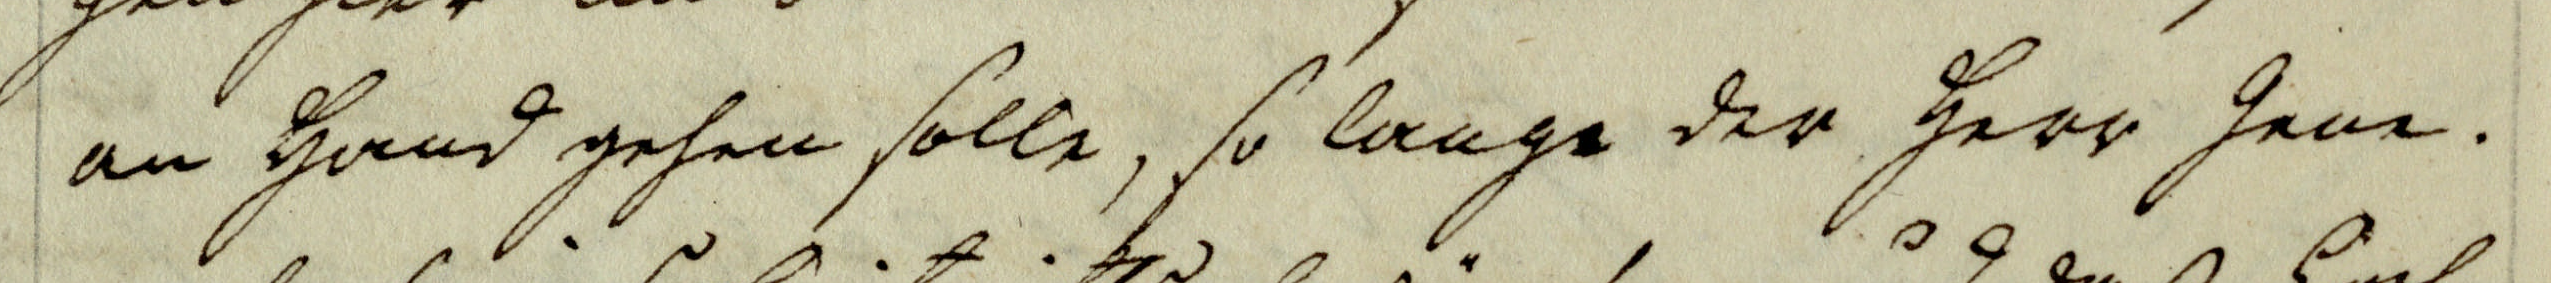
an Hand gehen solle, so lange der Herr Gene¬
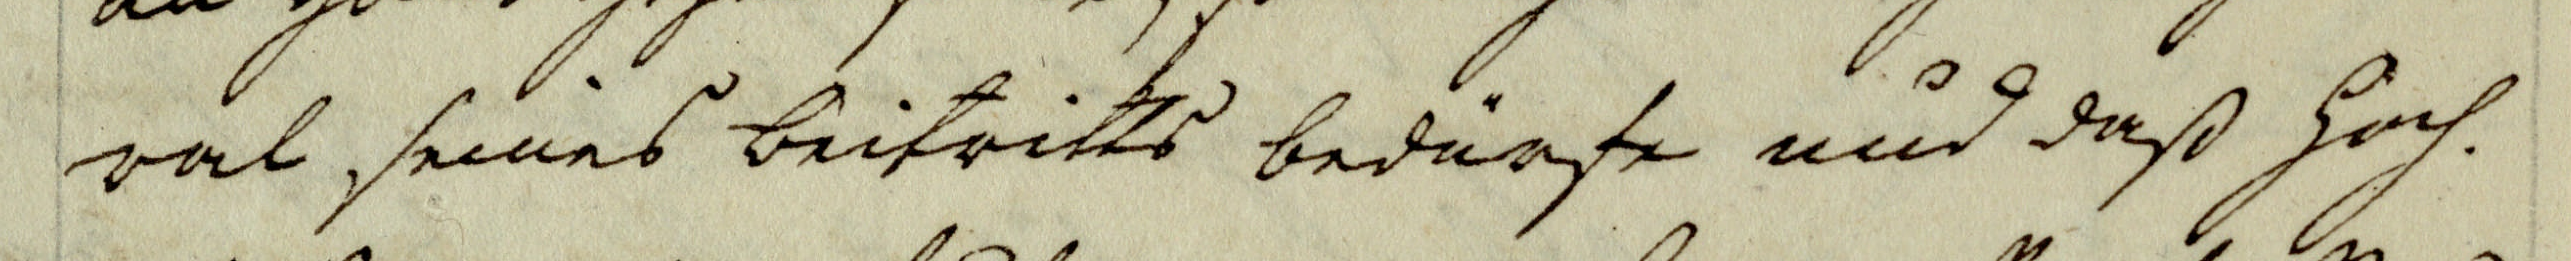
ral seines Beitritts bedürfe und daß Hoch¬
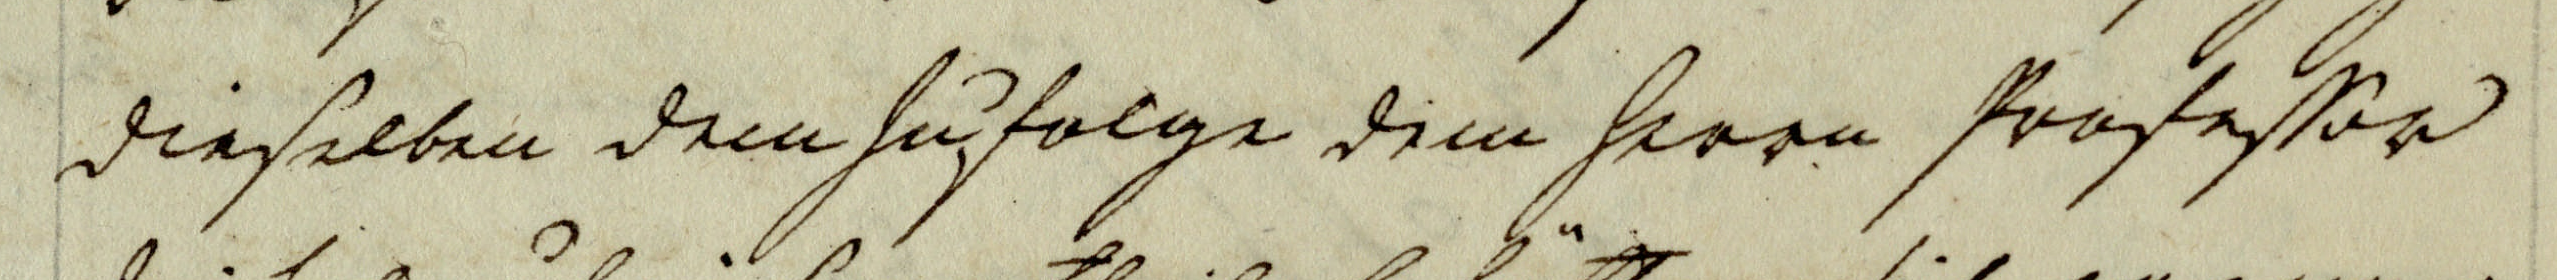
dieselben dem zufolge dem Herrn Professor
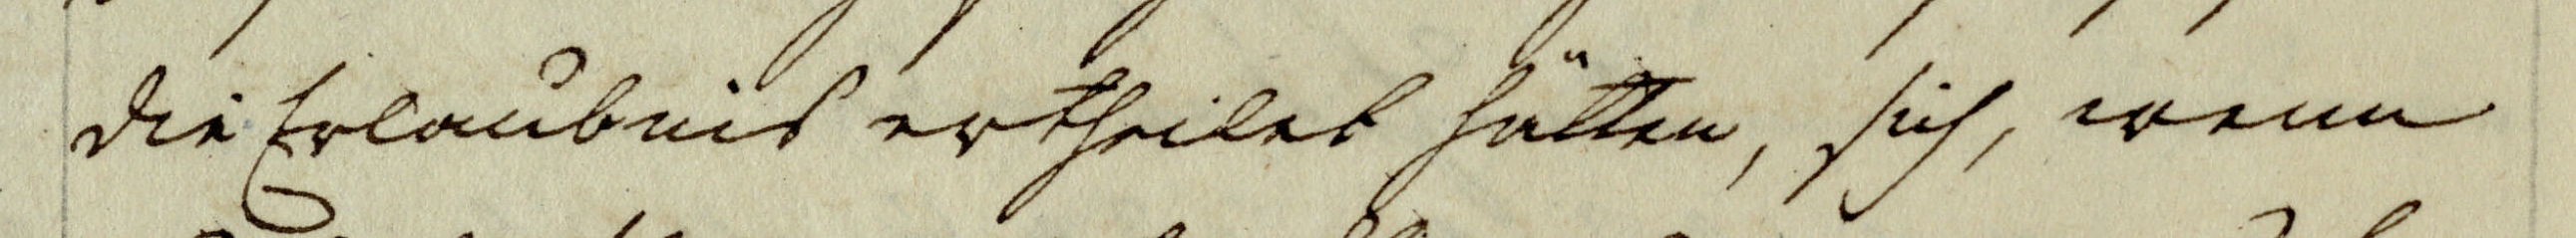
die Erlaubnis ertheilet hätten, sich, wenn
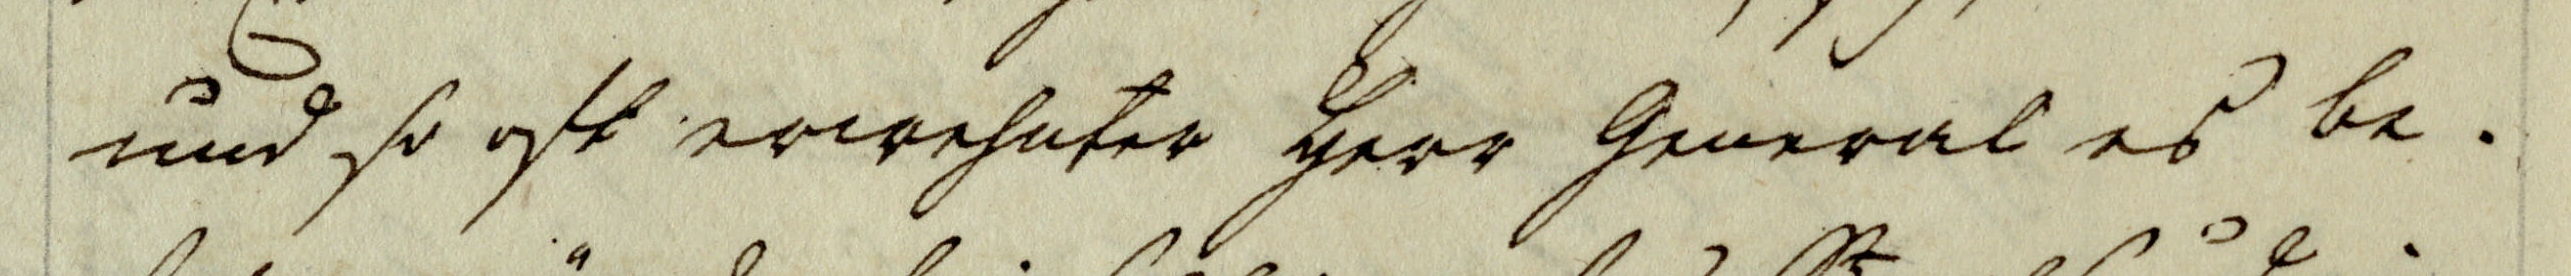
und so oft erwehnten Herr General es be¬
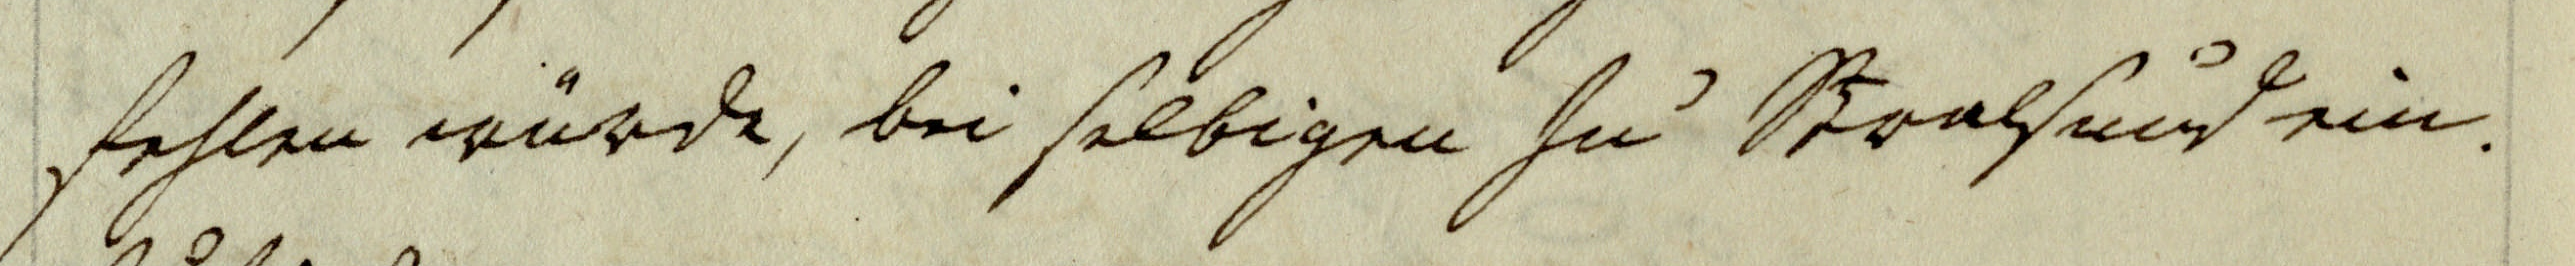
fehlen würde, bei selbigen zu Stralsund ein¬
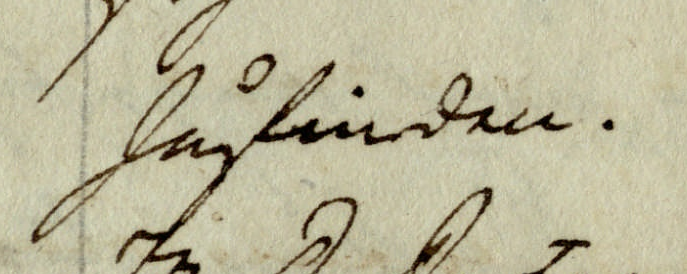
zufinden.
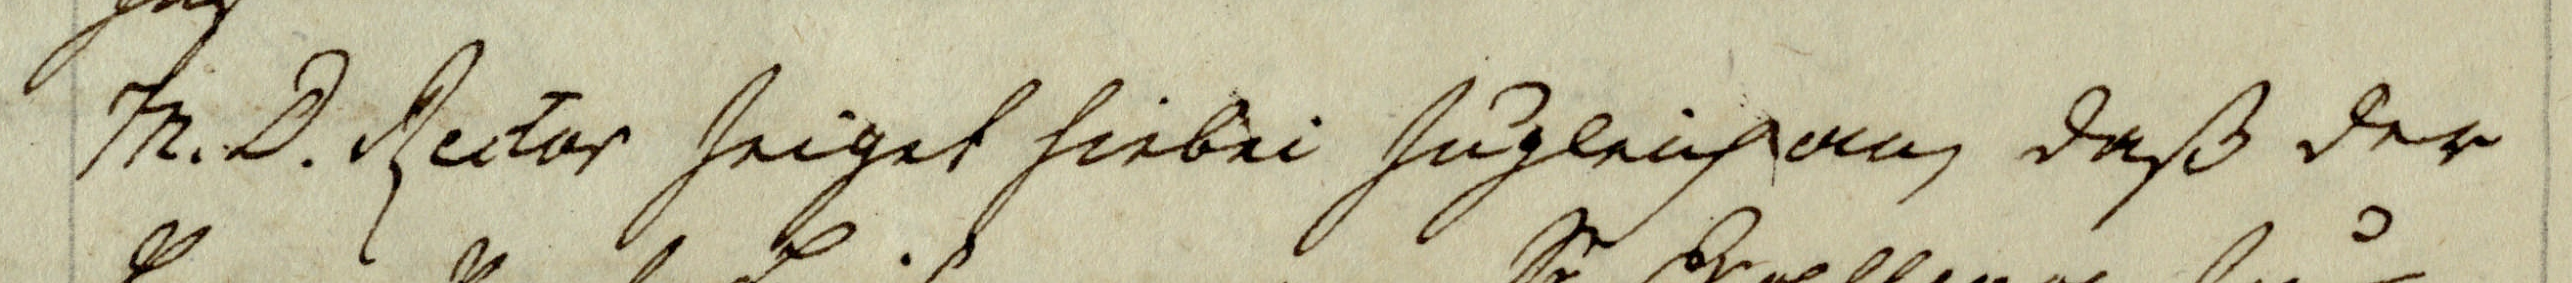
M. D. Rector zeiget hiebei zugleich an, daß der
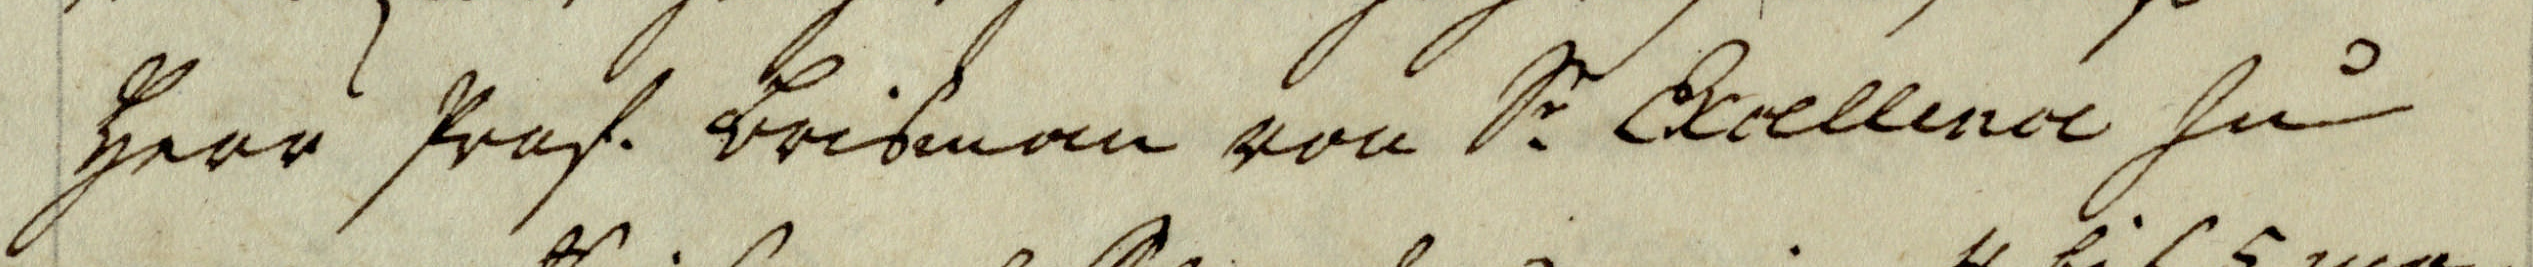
Herr Prof. Brisman von Sr Excellence zu
